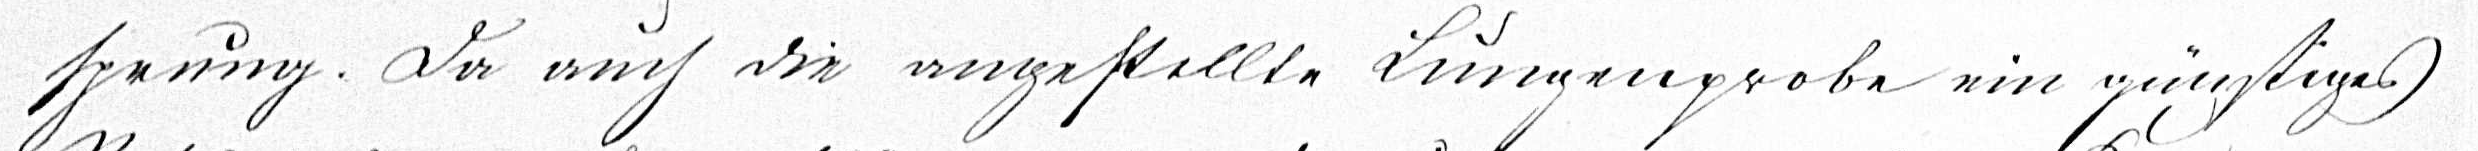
sprung. Da auch die angestellte Lungenprobe ein günstige
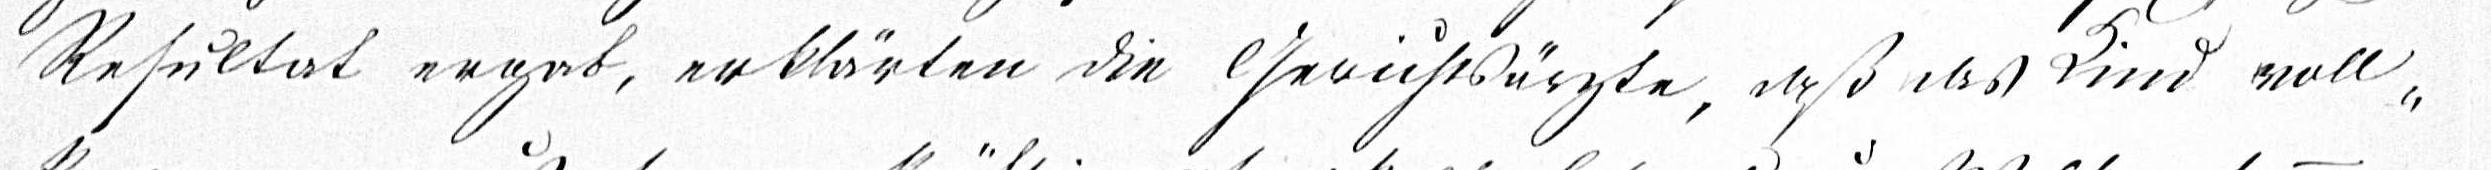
Resultat ergab, erklärten die Gerichtsärzte, daß das Kind voll¬
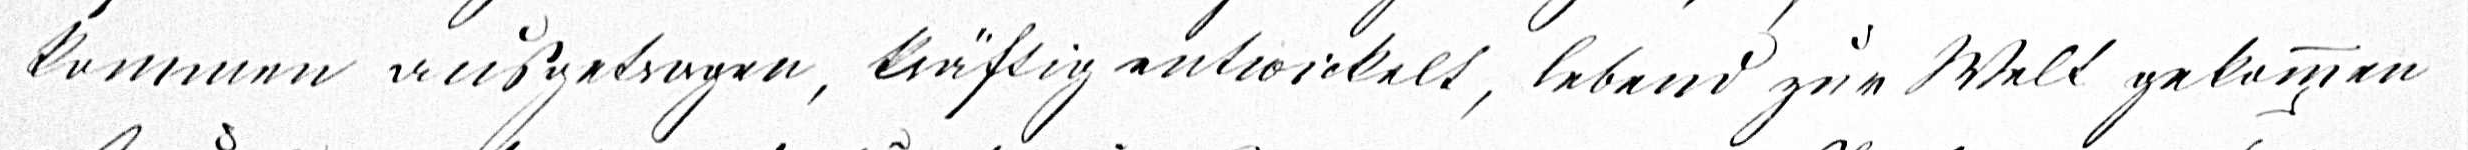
kommen ausgetragen, kräftig entwickelt, lebend zur Welt gekommen
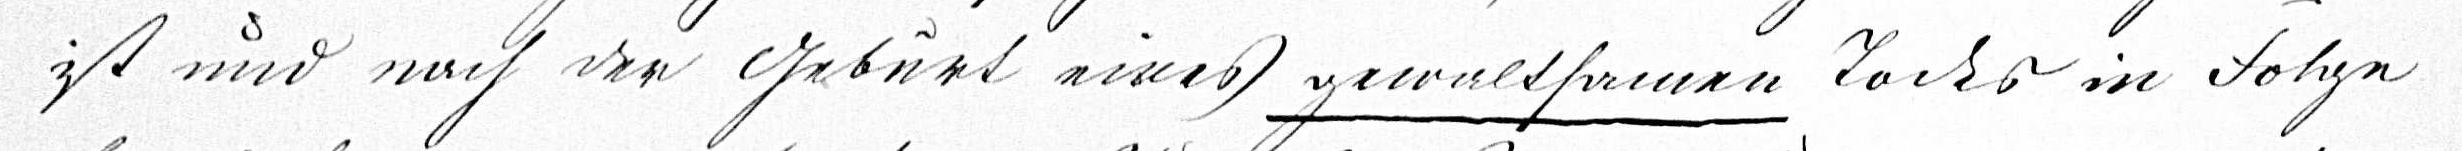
ist und nach der Geburt eines gewaltsamen Todes in Folge
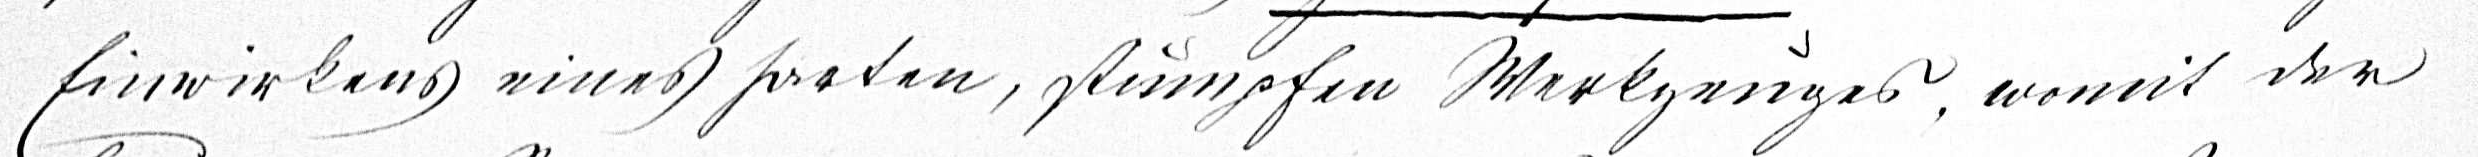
Einwirkens eines harten, stumpfen Werkzeuges, womit der
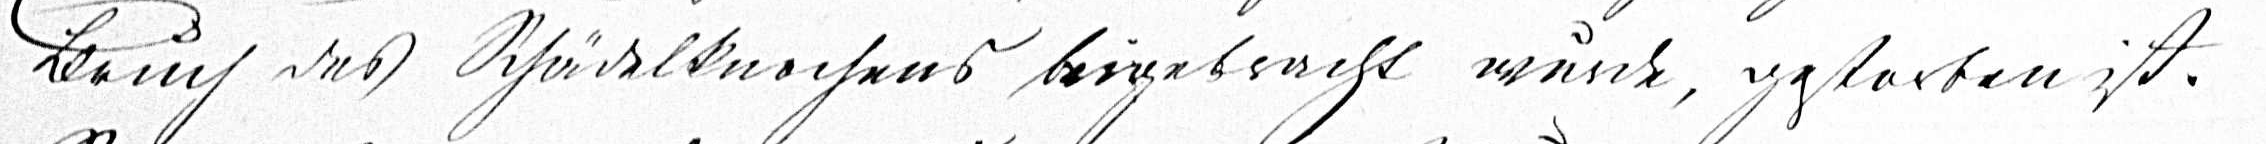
Bruch des Schädelknochens beigebracht wurde, gestorben ist.
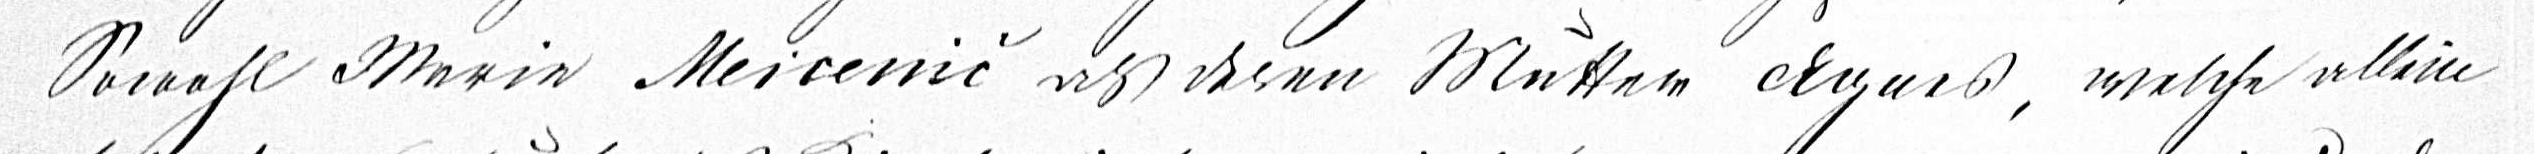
Sowohl Marie Meicenič als deren Mutter Agnes, welche allein
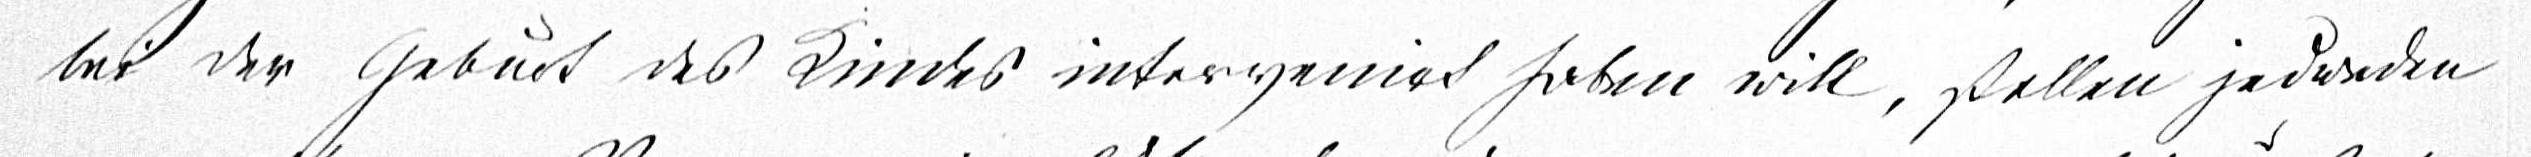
bei der Geburt des Kindes interveniert haben will, stellen jedwede
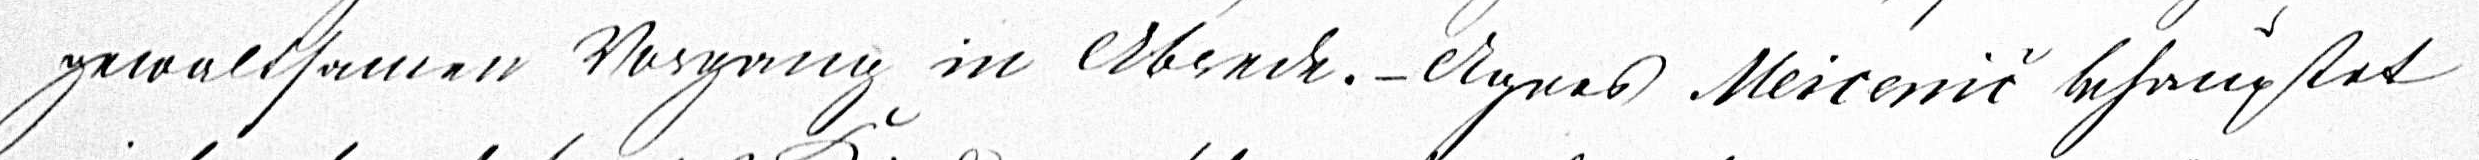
gewaltsamen Vorgang in Abrede. Agnes Meicenič behauptet
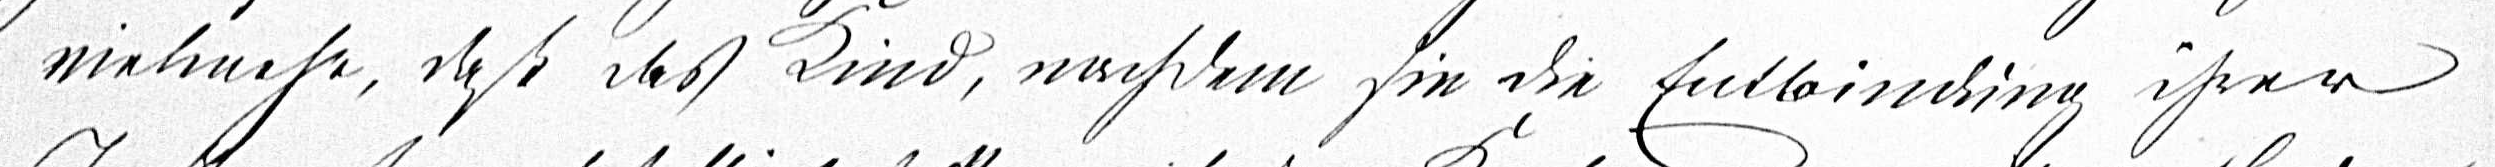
vielmehr, daß das Kind, nachdem sie die Entbindung ihrer
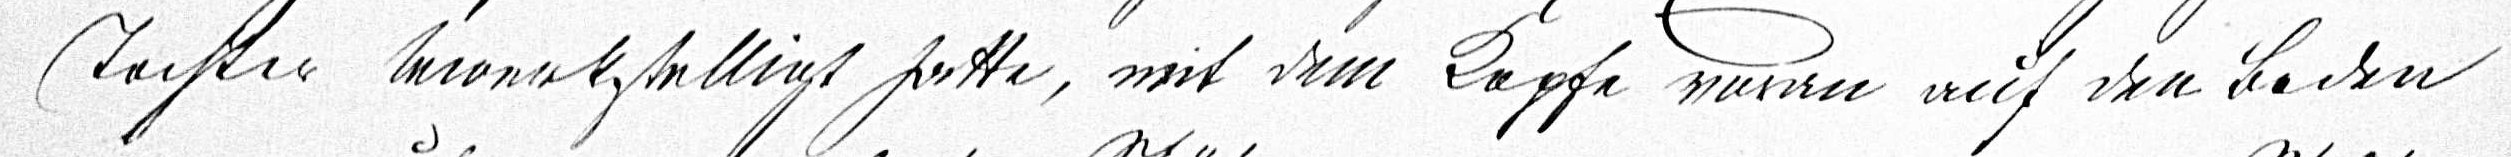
Tochter bewerkstelligt hatte, mit dem Kopfe voran auf den Boden
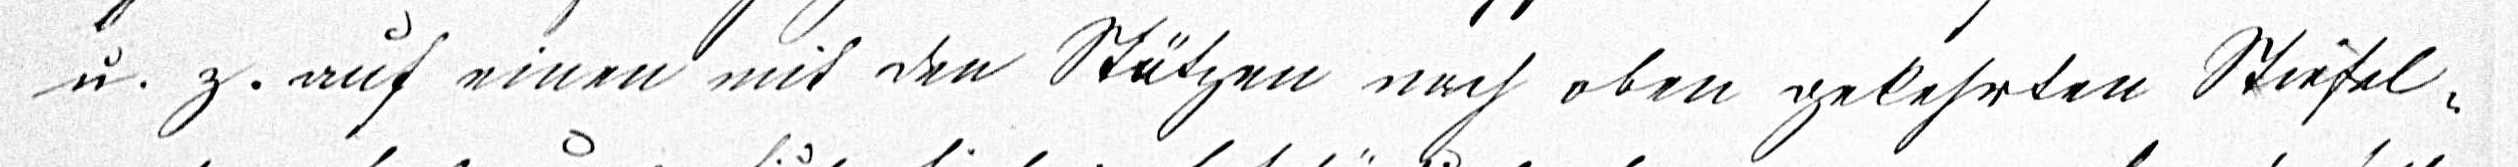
u. z. auf einen mit den Stützen nach oben gekehrten Stiefel¬
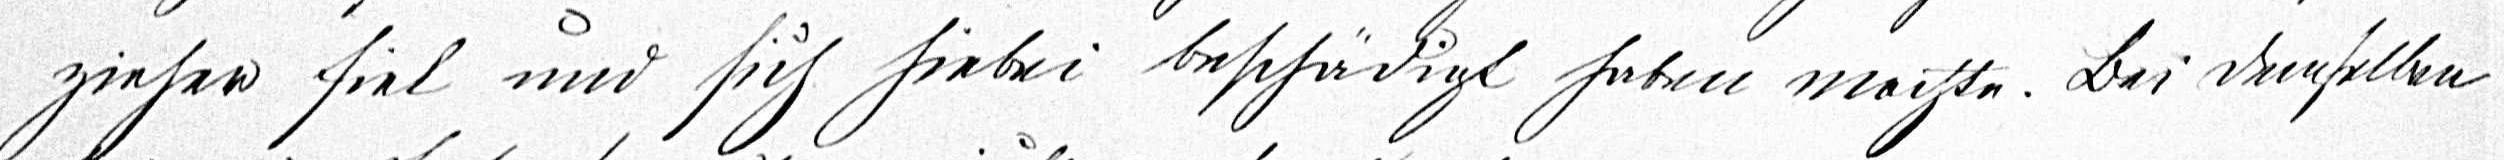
zieher fiel und sich hiebei beschädigt haben mochte. Bei denselben
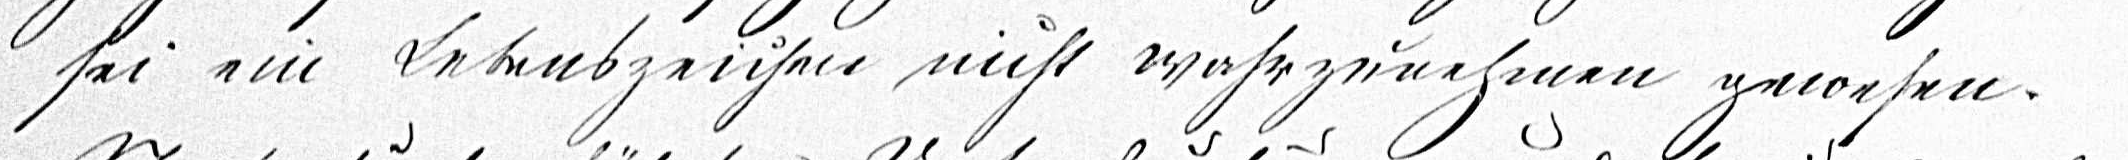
sei ein Lebenszeichen nicht wahrzunehmen gewesen.
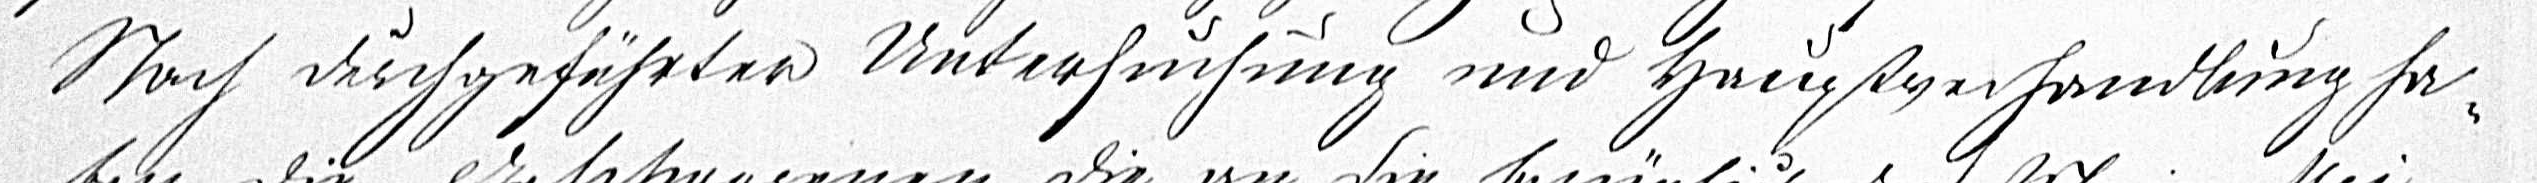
Nach durchgefürhter Untersuchung und Hauptverhandlung ha¬
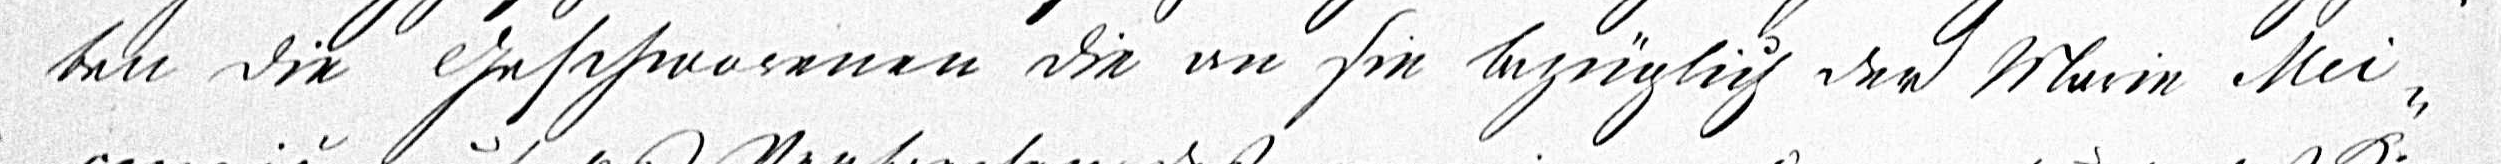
ben die Geschworenen die an sie bezüglich der Marie Mei¬
